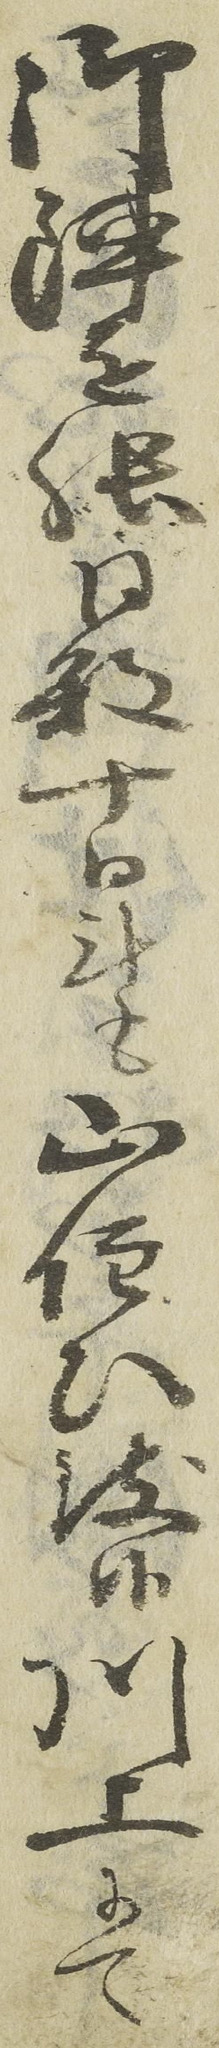御陣を張日数十日斗も山住ひ致候川上にて

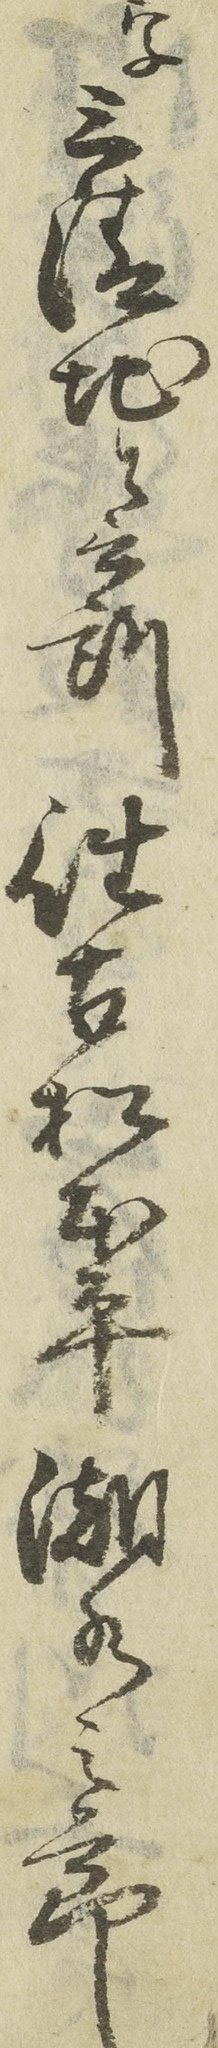字三清池と言所往古松本平湖水之節
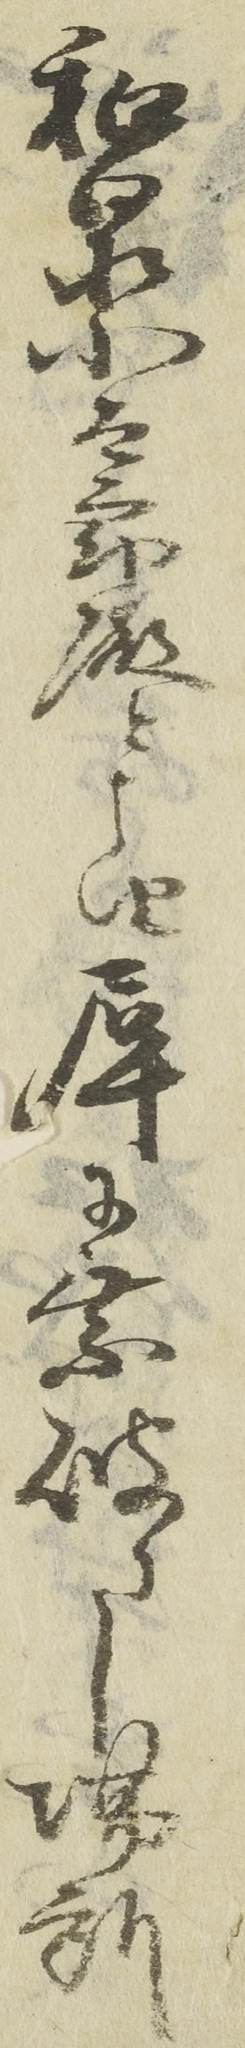和泉小太郎瀬殿と申由犀に乗破りし場所
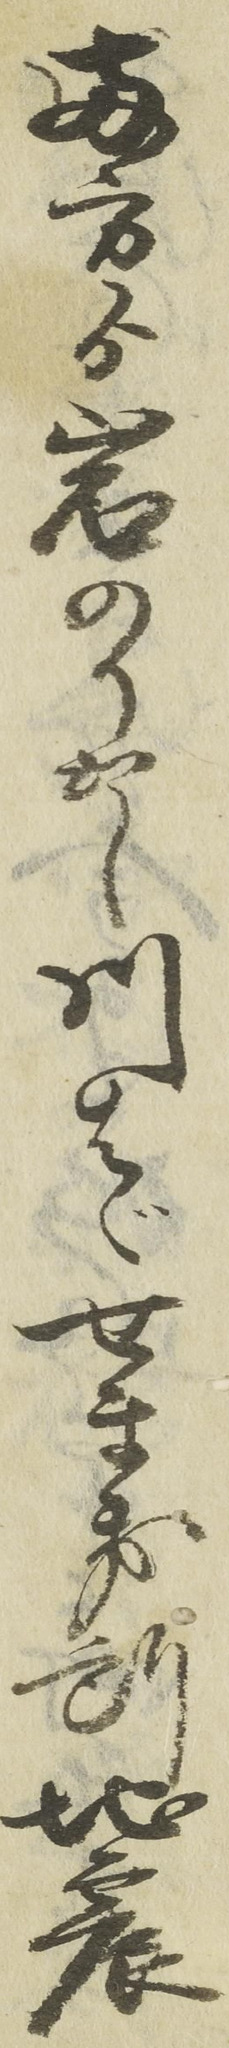両方ゟ岩のり出し川はゞせまき所地震
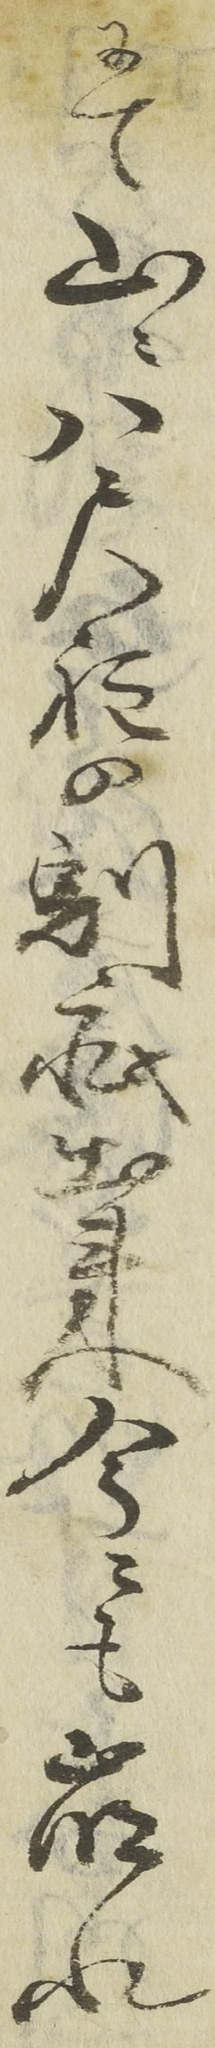にて山ニ八尺程の割疵出来今ニも崩れ
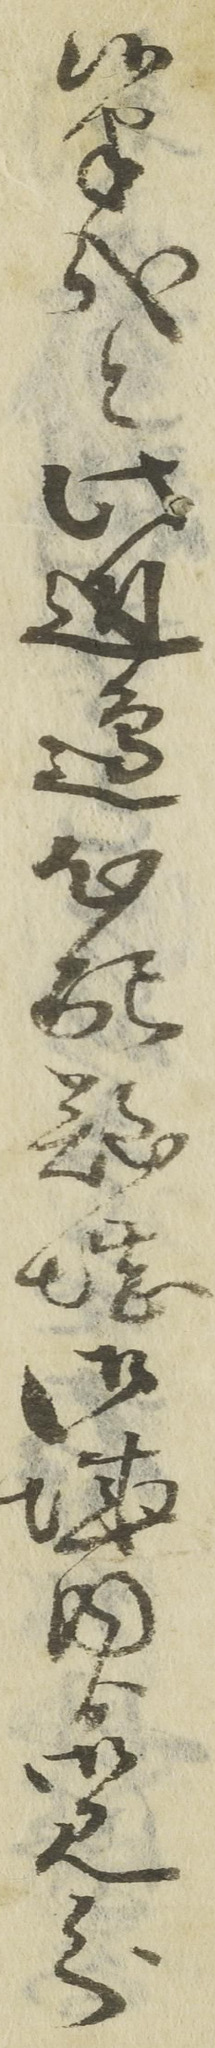候半哉と此近辺心配難堪御城内ゟ御見分
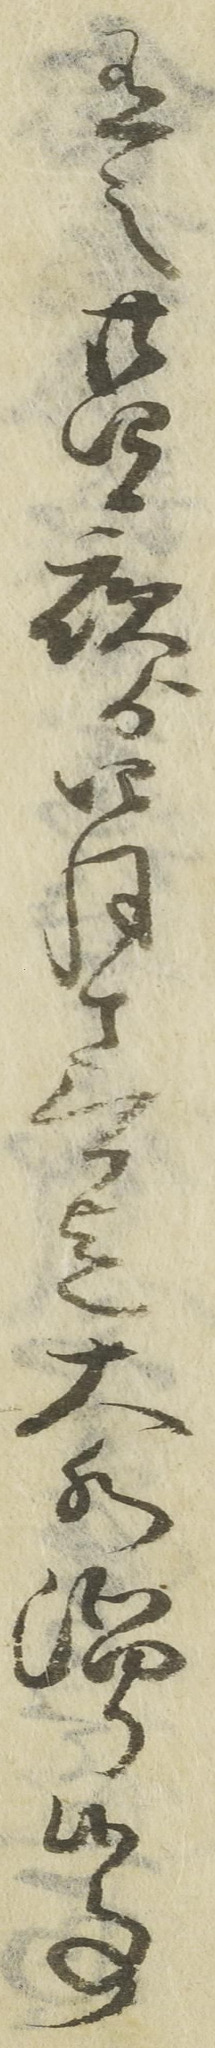有之廿四日夜ゟ四月十三日迄大水溜り候事
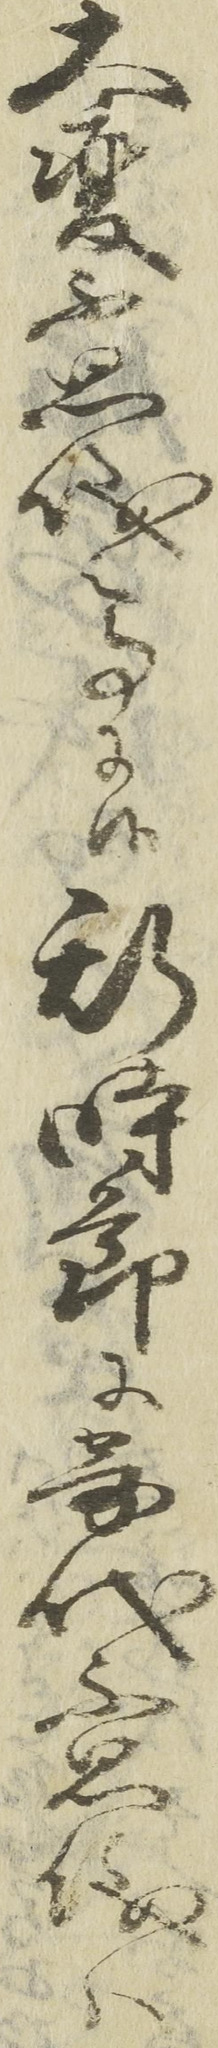大変不思議之事に候斯時節に奇代不思議ハ
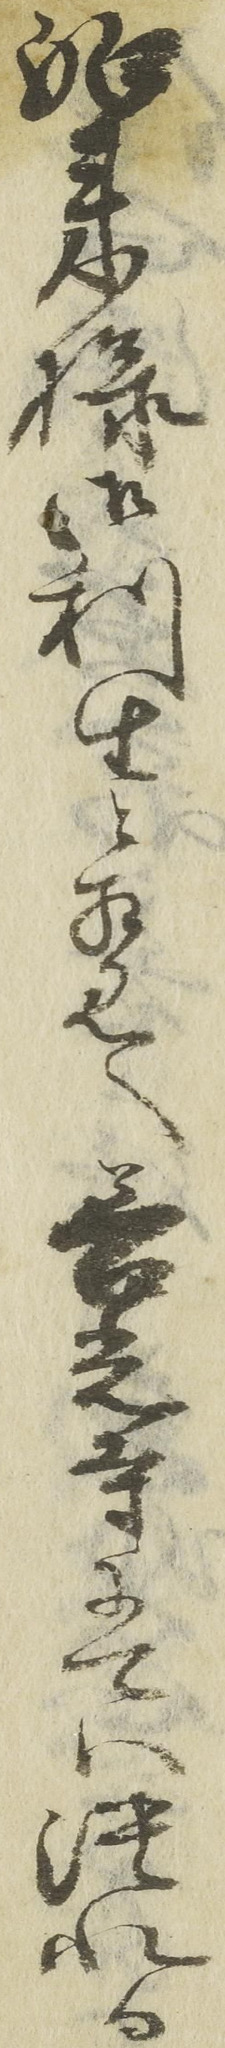如来様御利生と相見へ善光寺にてハ潰れる
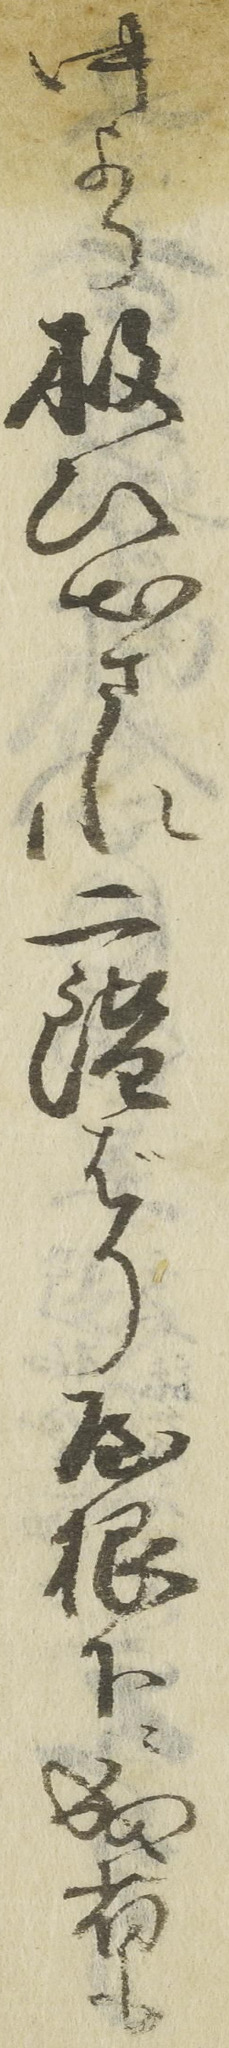中より救ひ出され二階ばり屋根下ニ成者も
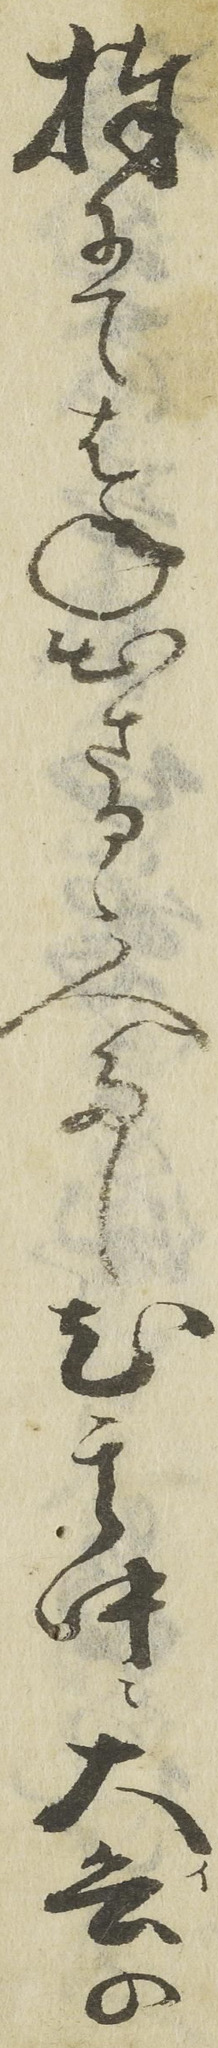棒にてはね出さるゝ人多し尤其中ニ大意の
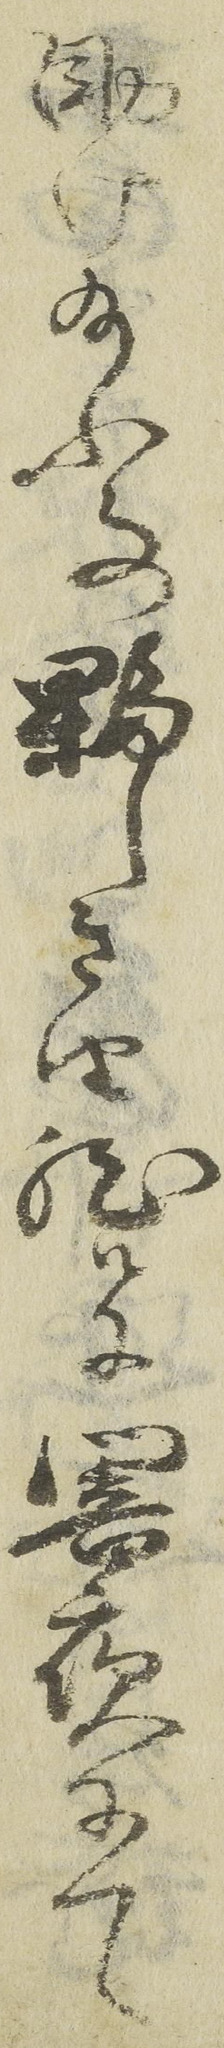助け給ふ事夥しき由然ルに闇夜にて

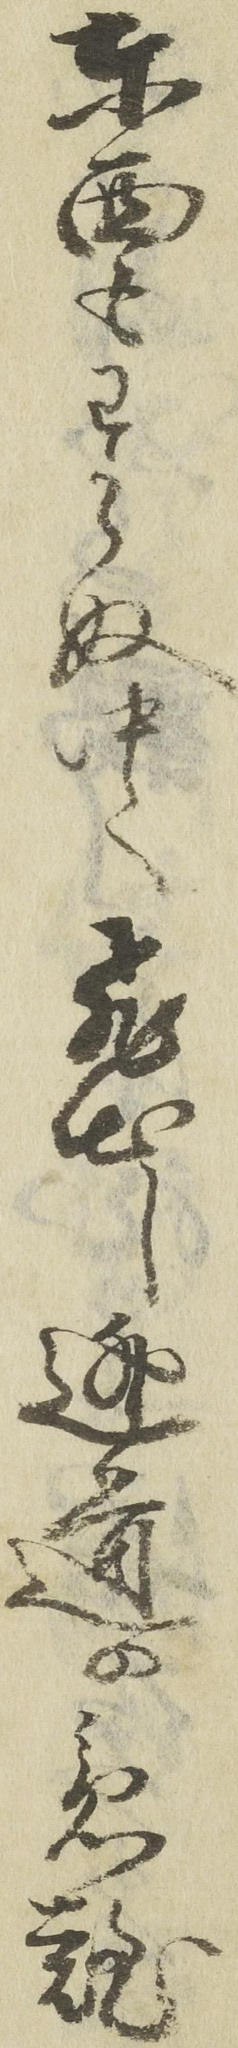東西もわからぬ中へ飛出し逃道の急難
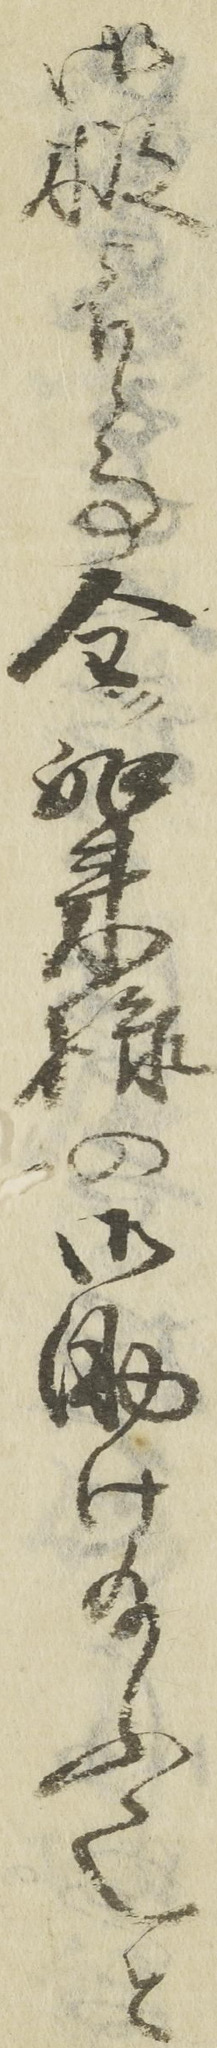御救被下候事全ク如来様の御助け給ふ也と
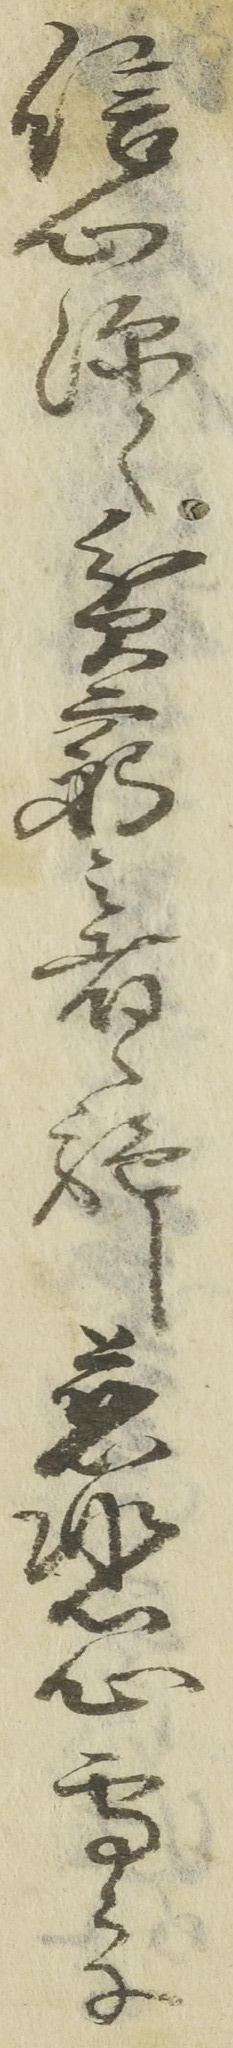信心深く貧窮之者へ施し慈悲心専らに
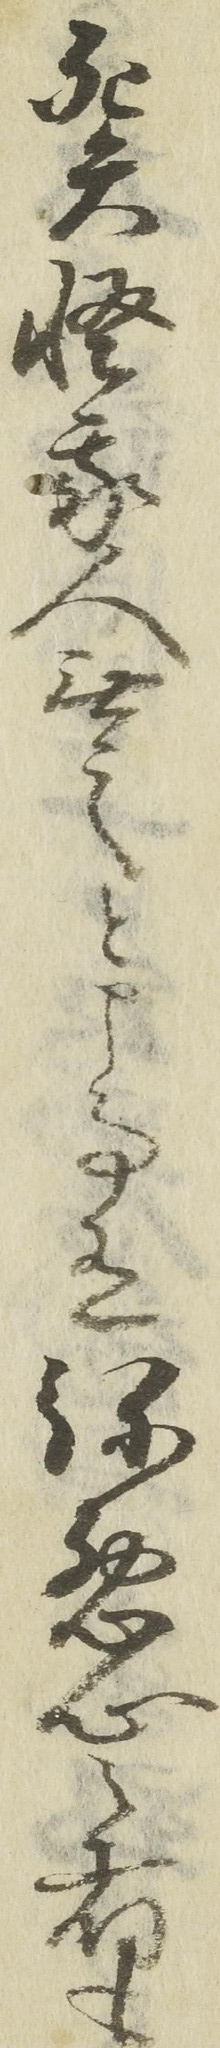死失怪我人無之と申事有弥悪心之者も
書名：弘化四　大地震由来　全
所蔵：東京大学地震研究所図書室 Earthquake Research Institute Library, The University of Tokyo, JAPAN
